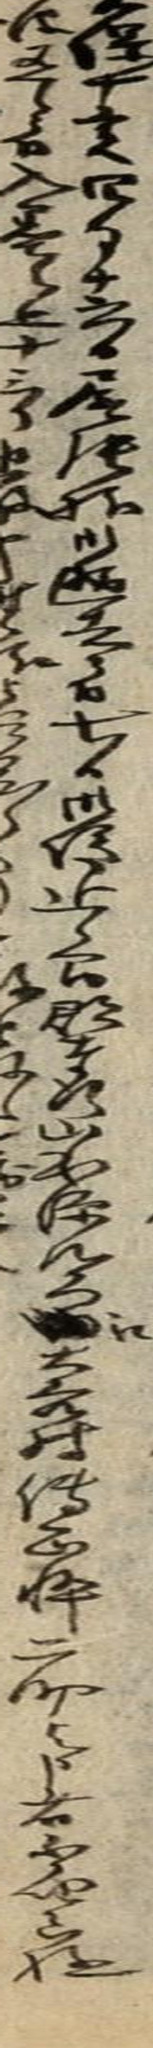一天保十亥四月十六日尾張様御逝去に付七日御停止之間郡奉行山本源左衛門え大谷村伝正悴二助と申者不届至極
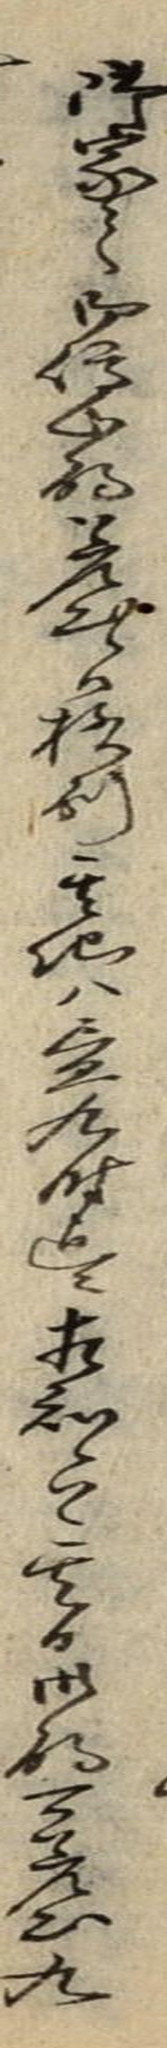御家々へ御停止触差出候は格別其他は昼九時迄に相知候はゝ其日御触可差出九
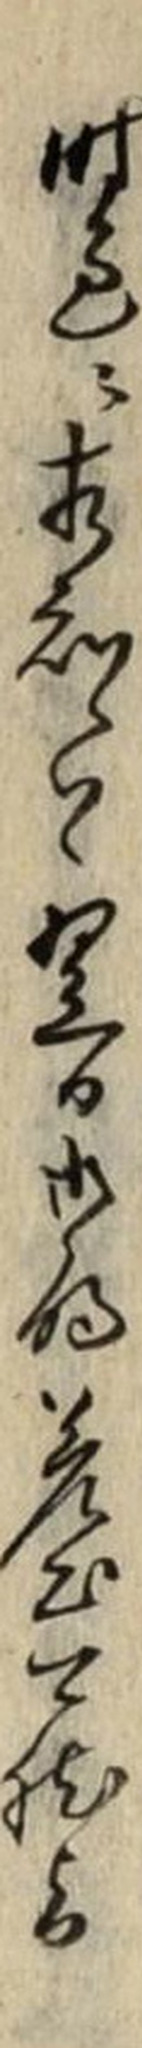時過に相知候はゝ翌日御触差出可然旨
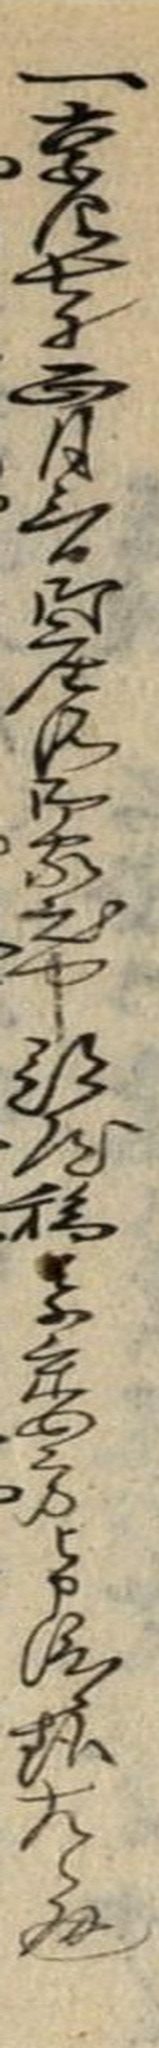一享保七刁正月三日御座所御家老中部屋稲葉采女方被申渡趣左之通
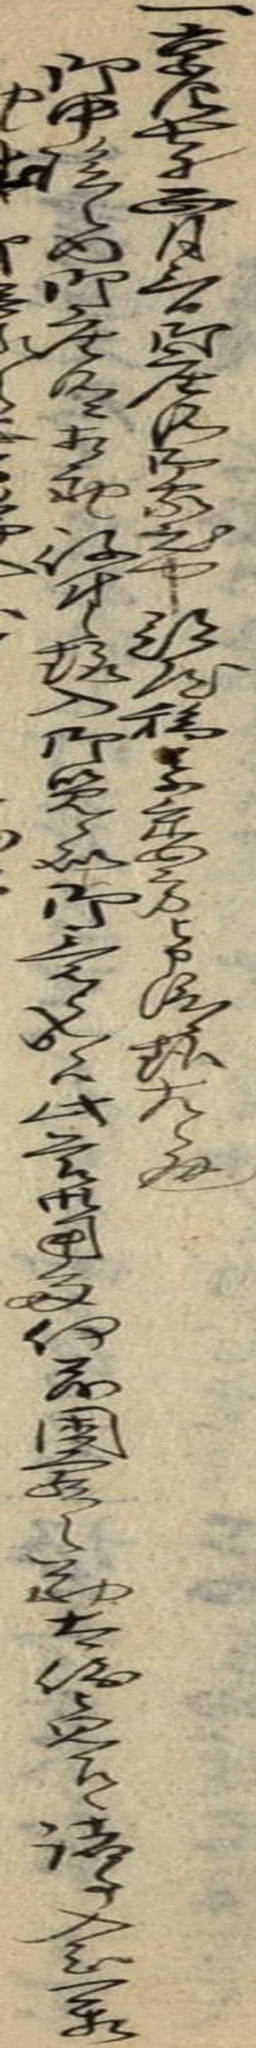御中陰之内御座所に相勤候役付之趣入御覧候処御意被成候は此節御用多何も困窮之勤太儀被思召候諸事入念可相
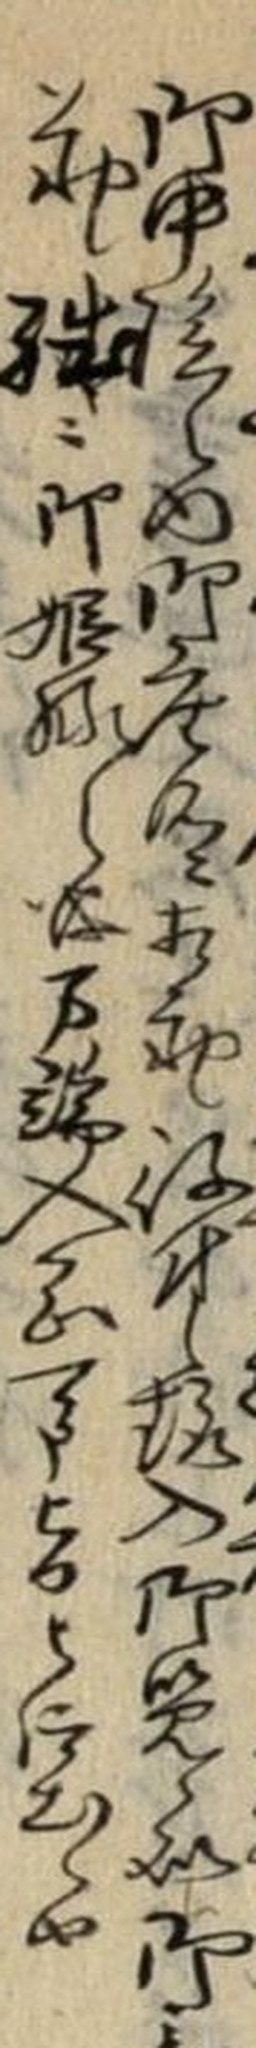勤候殊に御姫様之儀万端入念可申旨被仰出候由
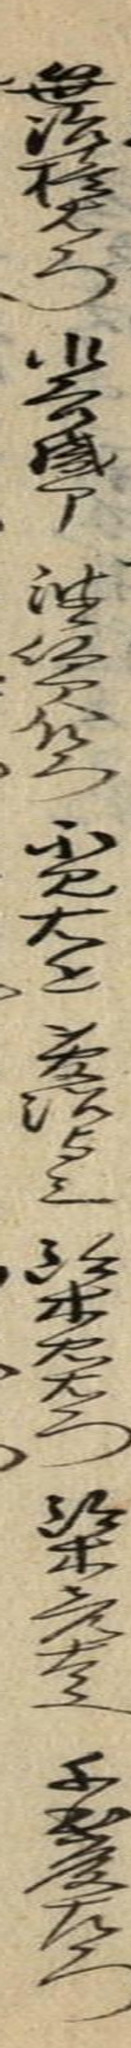笹治権右衛門水谷織部波々伯部八左衛門永見右近菅沼与三鈴木忠右衛門鈴木彦大夫千本藤左衛門
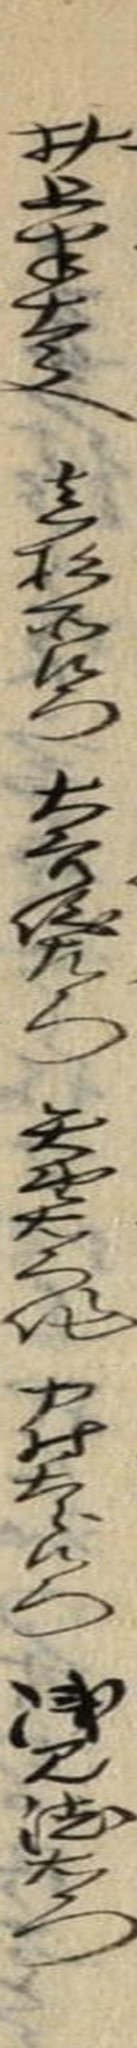井上半大夫真杉所左衛門大谷儀左衛門矢野右衛門作中村太郎左衛門浅見徳右衛門
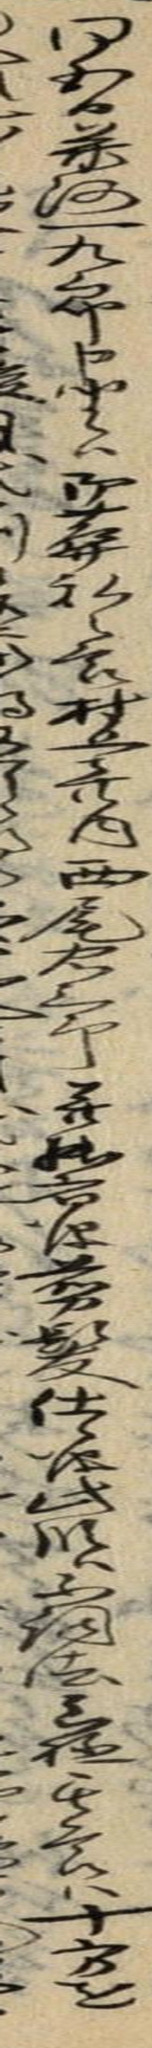一同五日並河一九郎申聞候は御葬礼之節村上喜内西尾忠三郎并拙者儀剪髪仕候儀此段は不調法至極其節は十方を
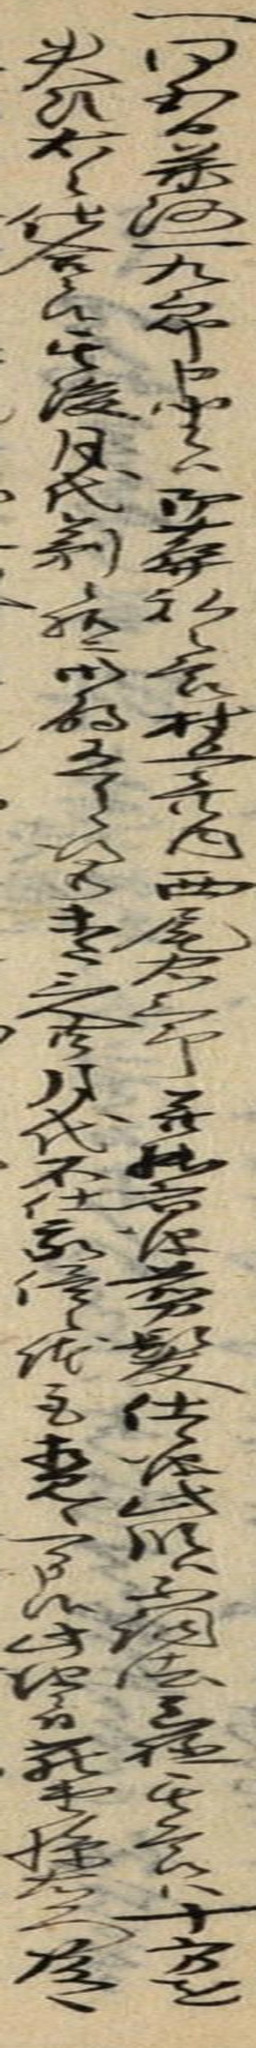失ひ右之仕合に候其後月代剃候様に御触有之候得共未た三人共月代不仕我儘之体にも相見へ可申候此儀に付荻野孫右衛門殿へ
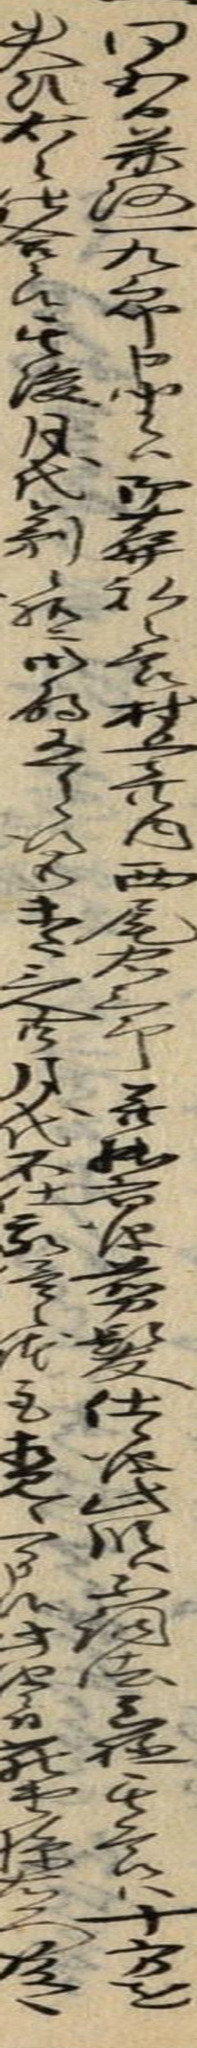失ひ右之仕合に候其後月代剃候様に御触有之候得共未た三人共月代不仕我儘之体にも相見へ可申候此儀に付荻野孫右衛門殿へ
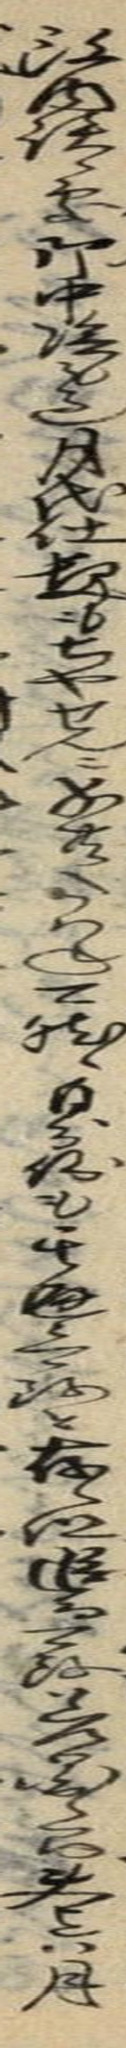致内談候処御中陰も過月代仕髪もちやせんに成共たはね可然候自分儀も其通に可致と存候但追て可致差図候間夫迄は月
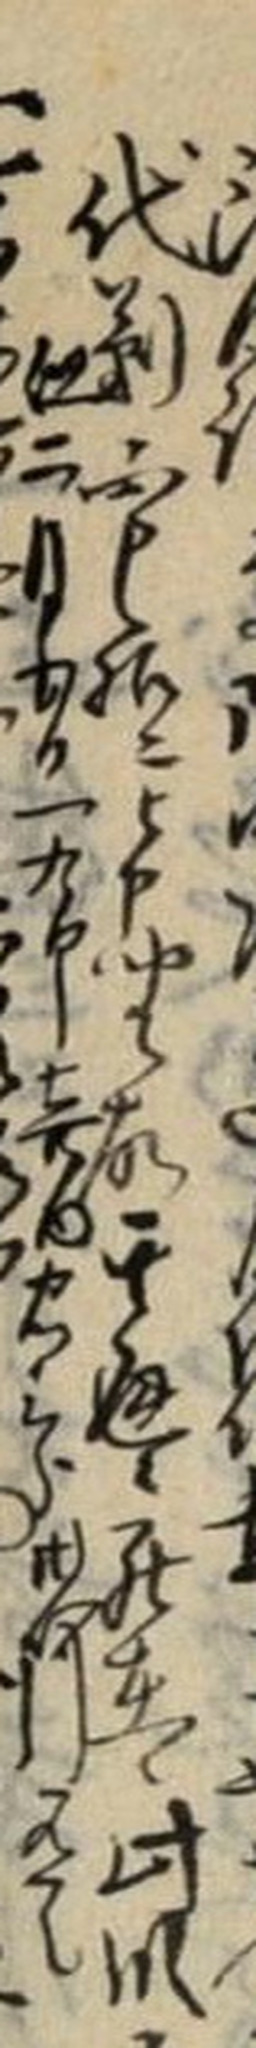但二月五日一九郎喜内忠三郎御呵有之
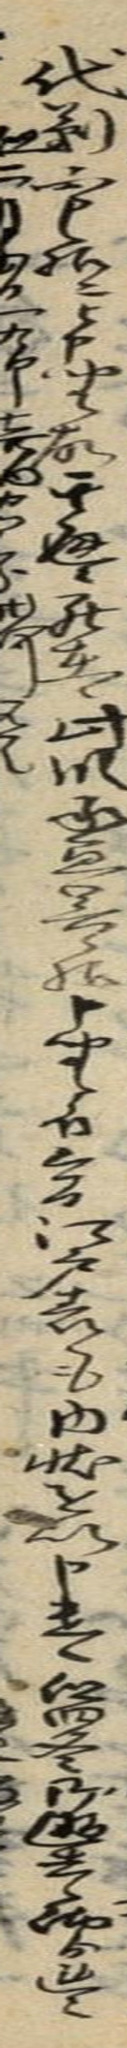代剃不申様に被申聞候故其通に罷在候此段承置呉候様申聞候に付今日江戸表へも内状を以て申遣候但旧冬御逝去之砌ゟ連々此儀留有之
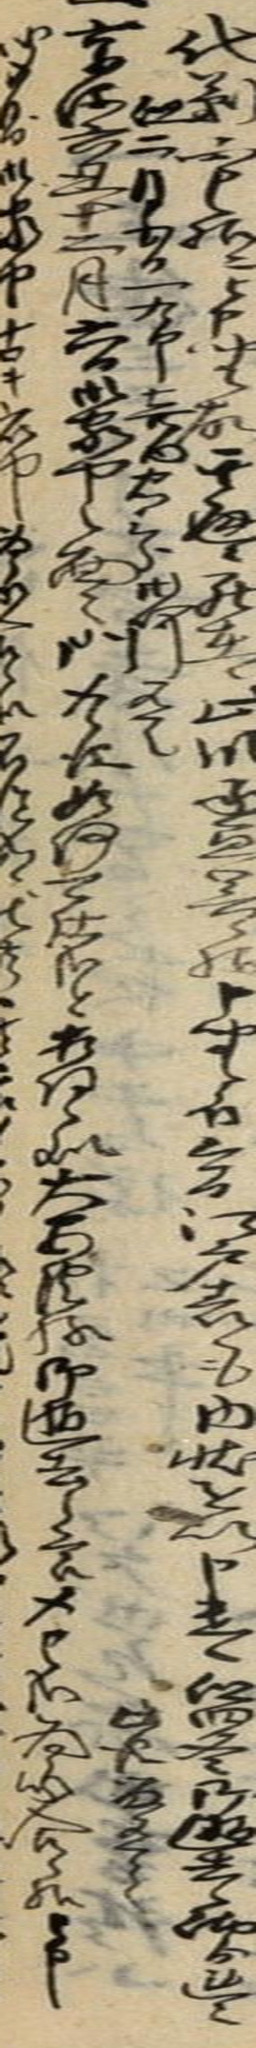一享保六丑十二月六日御家中之面々門〆候儀如何可仕哉と相伺候処大安院様御逝去之節〆申候哉為承合候様被申
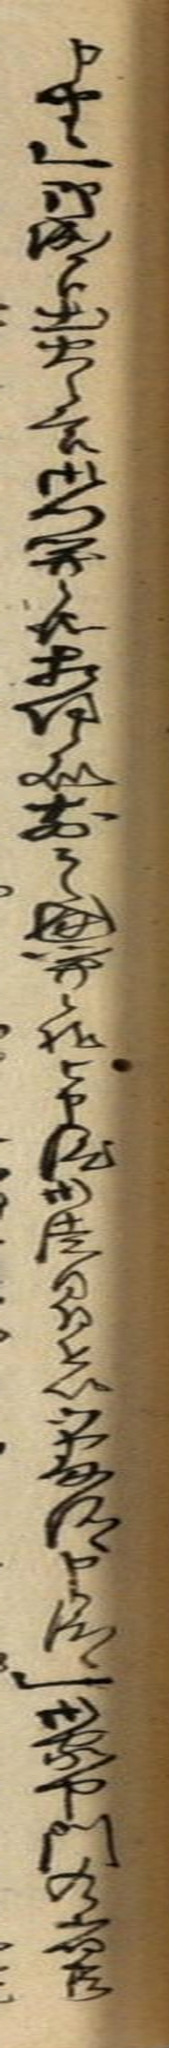申聞候」御城下出火之節御門開之儀相伺候処前々之通開候様被申渡御徒目付を以御番所へ申渡候」御家中門〆候者共
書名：御停止異変死失
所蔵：福井県文書館 Fukui Prefectural Archives
